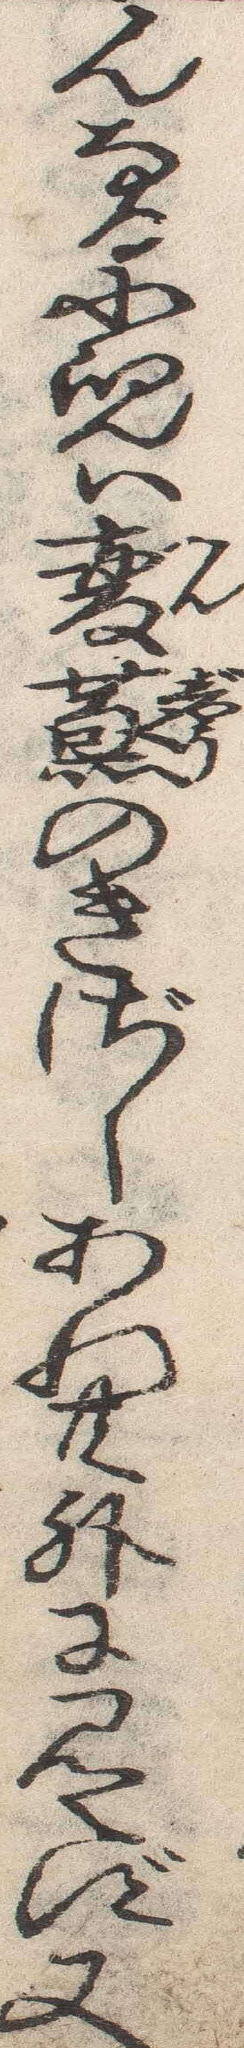んなる小児は変蒸のきざしあれ共外に見えず又
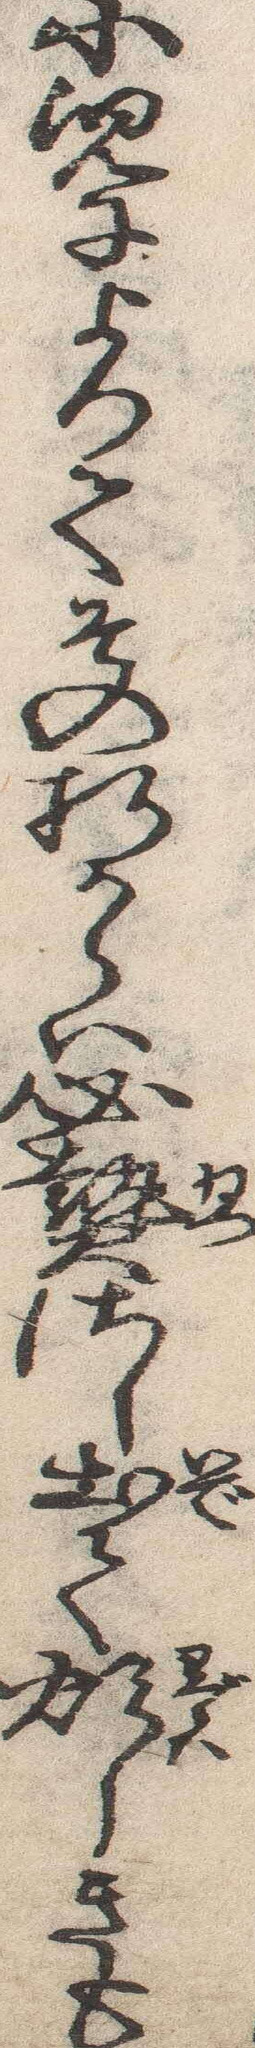小児によりてその折からは必熱さし出て煩しきも
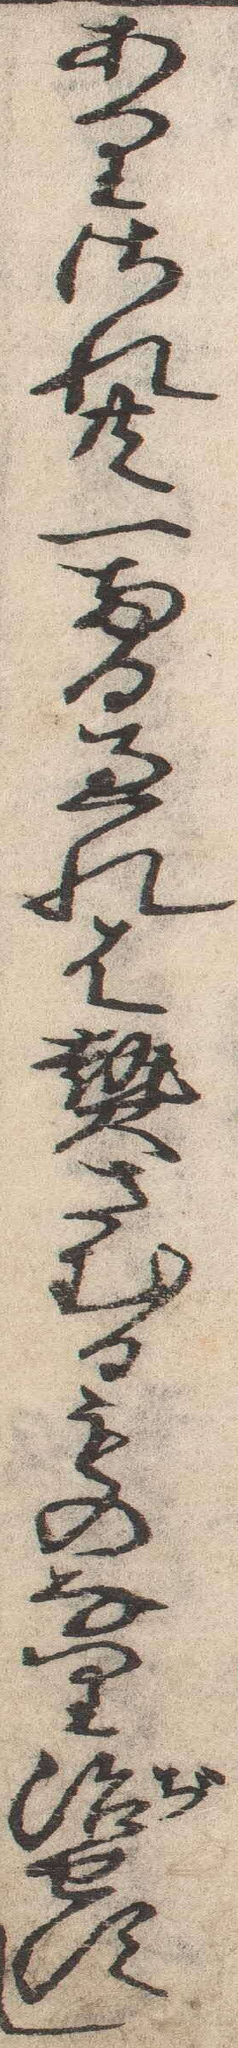ありされ共一両日過れは熱さむるものなり治せすし

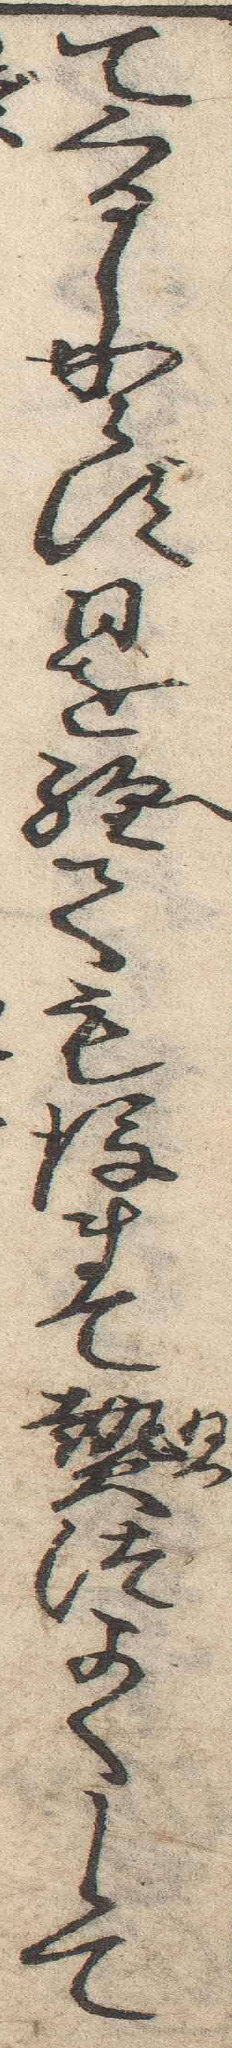てくるしからず日を経ても後まて熱つよくして
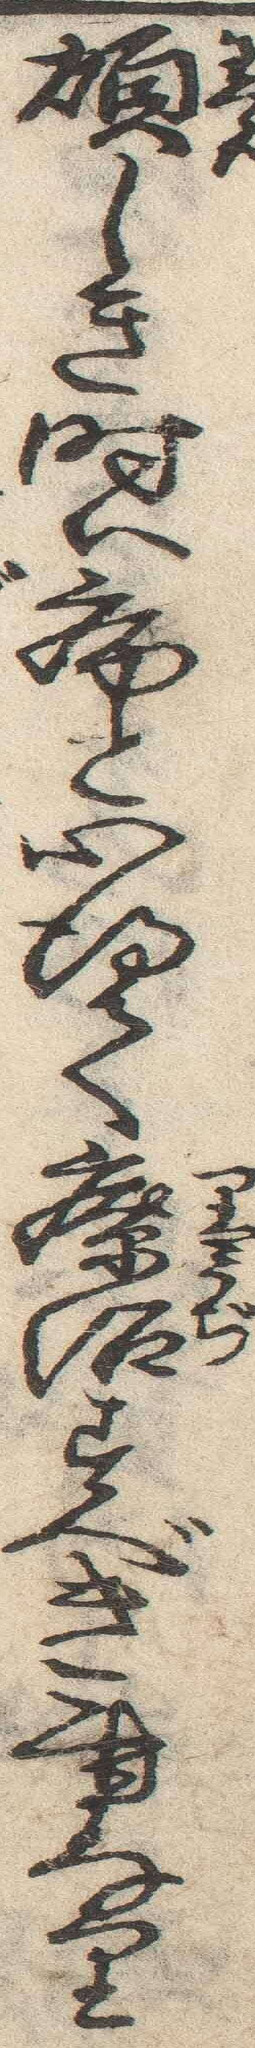煩しき時は病と心得て療治すべき事なり
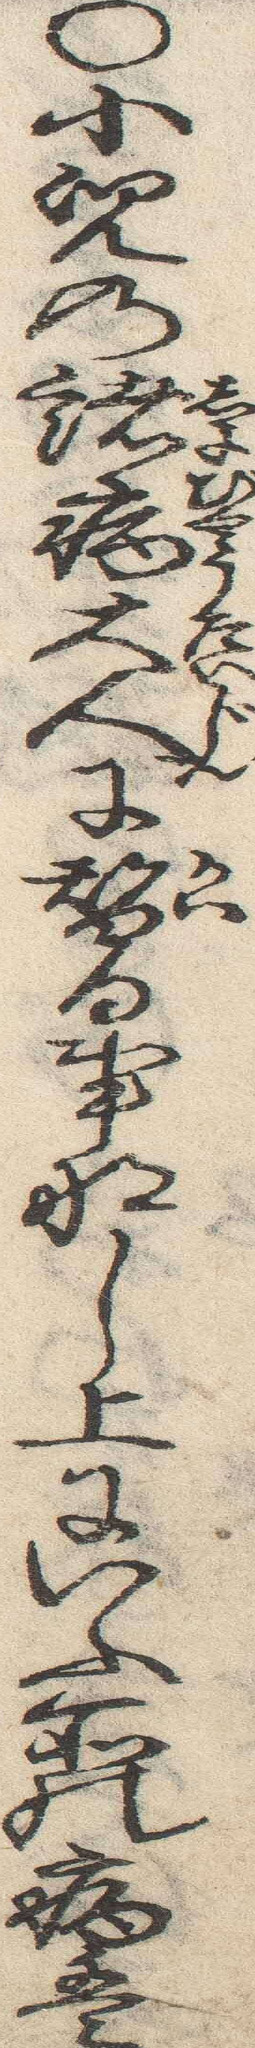○小児の諸病大人に替る事なし上にいふ所の病は
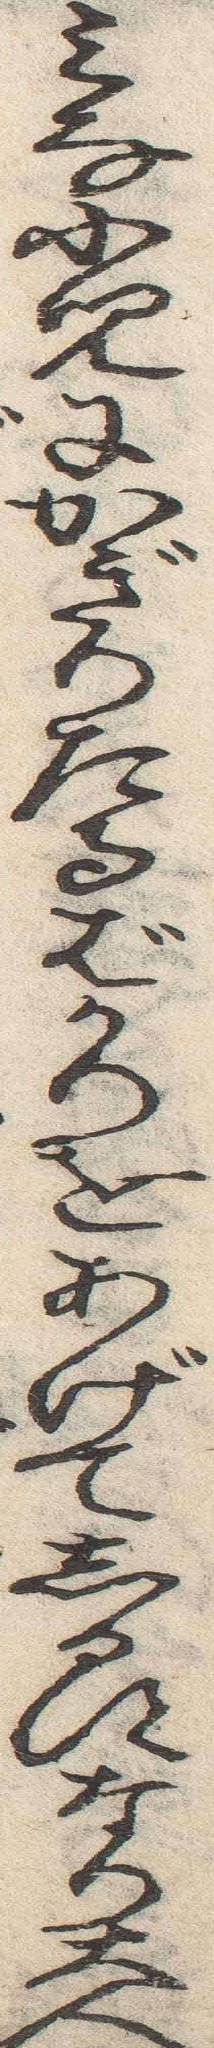みな小児にかぎりたるばかりをあげてしるすなり大人
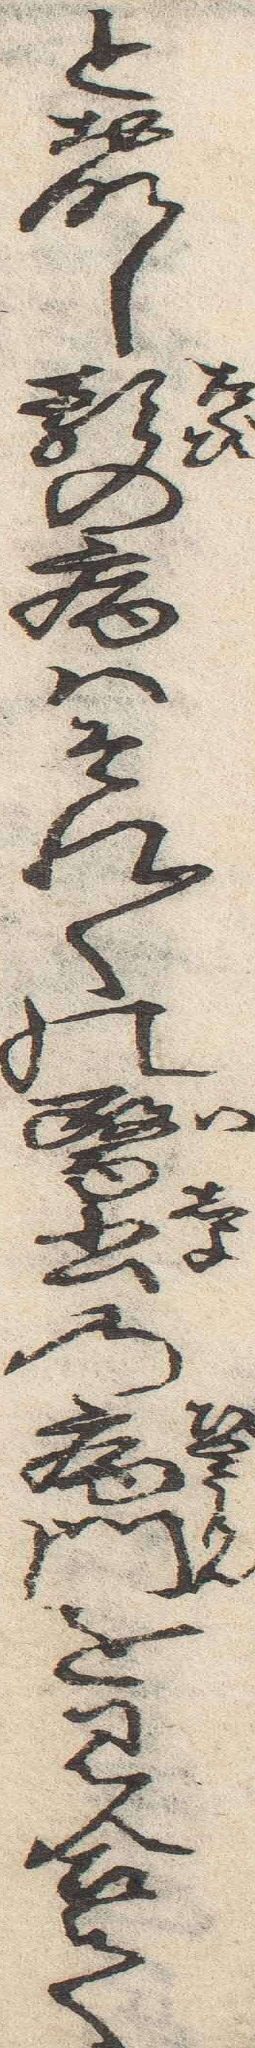とおなし類の病はそれ〳〵の医書の病門を見合て
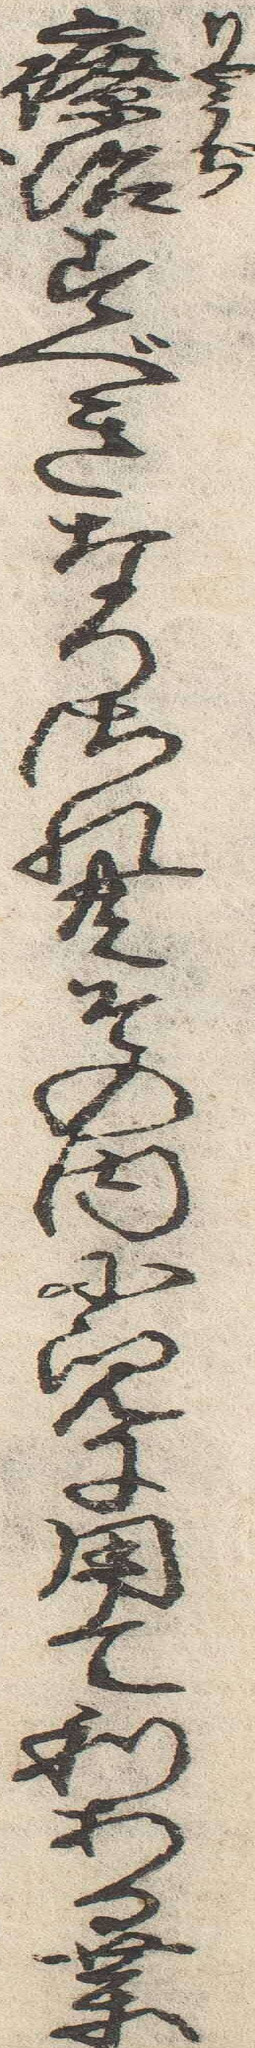療治すべきなりされ共その内に小児に用て利ある薬
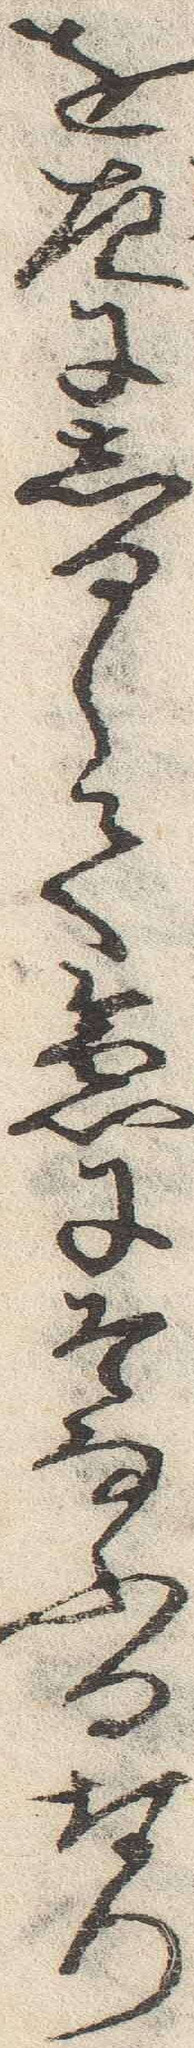を左にしるして急にそなふるなり
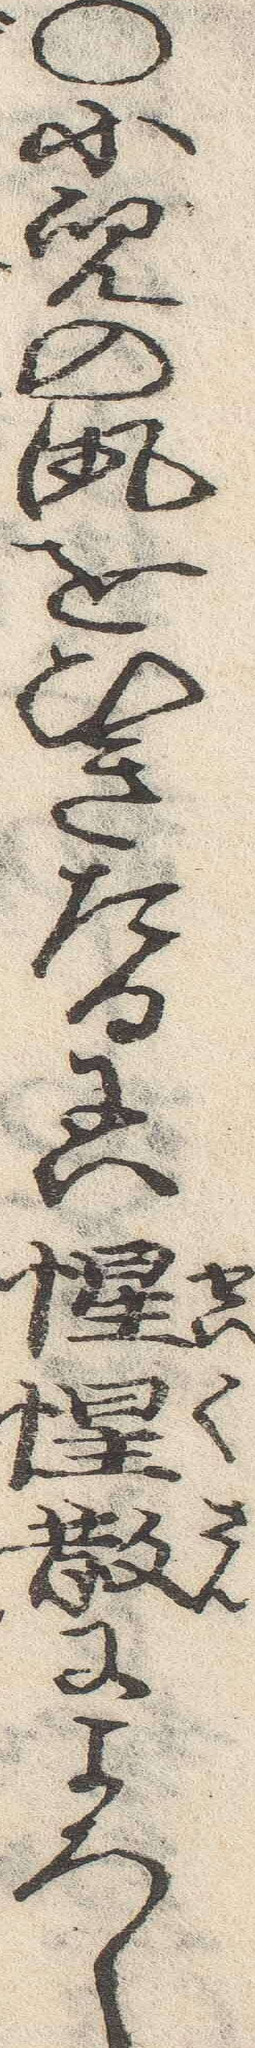○小児の風をひきたるには惺惺散によろし人参
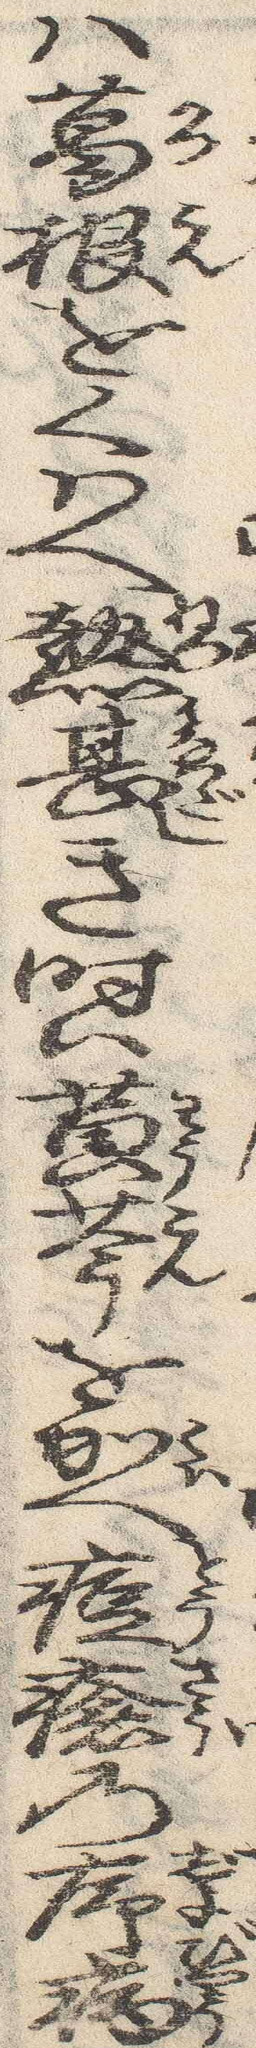は葛根をくわへ熱甚き時は黄芩を加へ痘瘡の序病
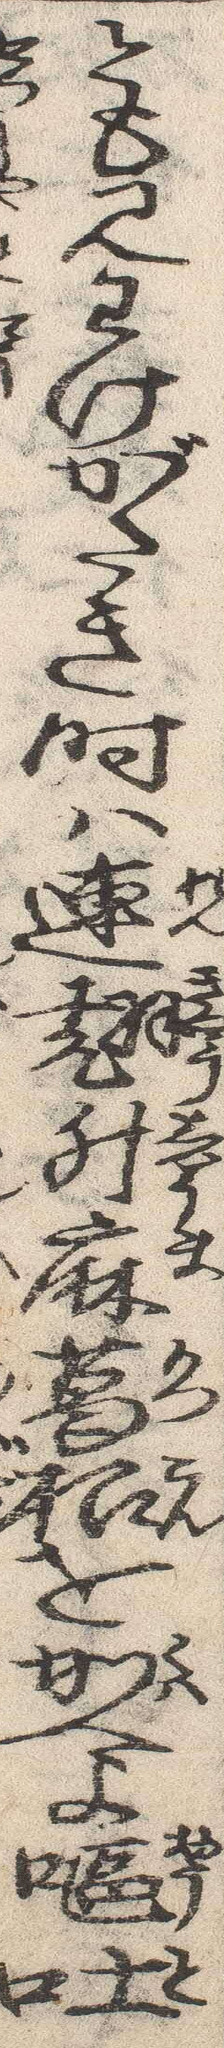とも見わけがたき時は連翹升麻葛根を加へよ嘔吐
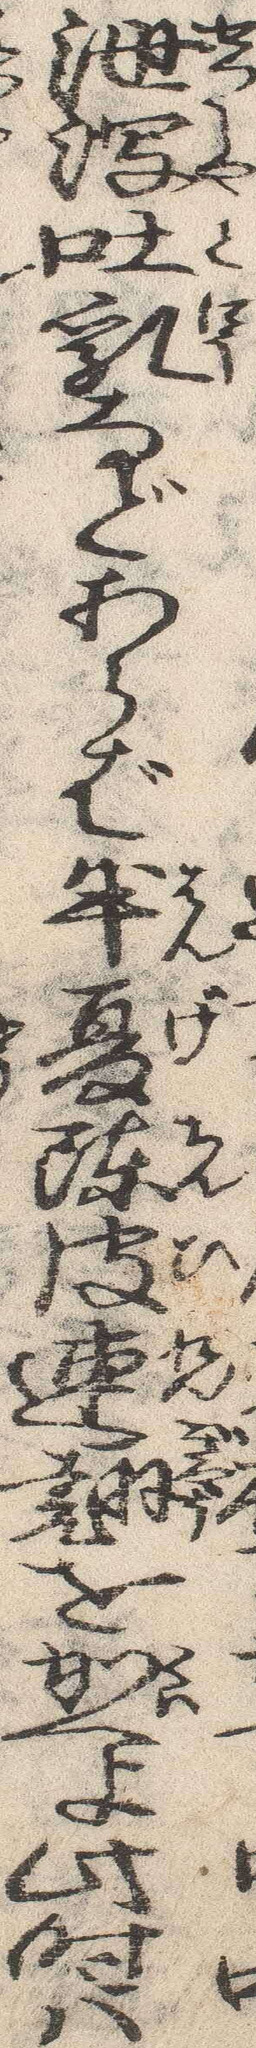泄瀉吐乳などあらば半夏陳皮連翹を加へよ此時は
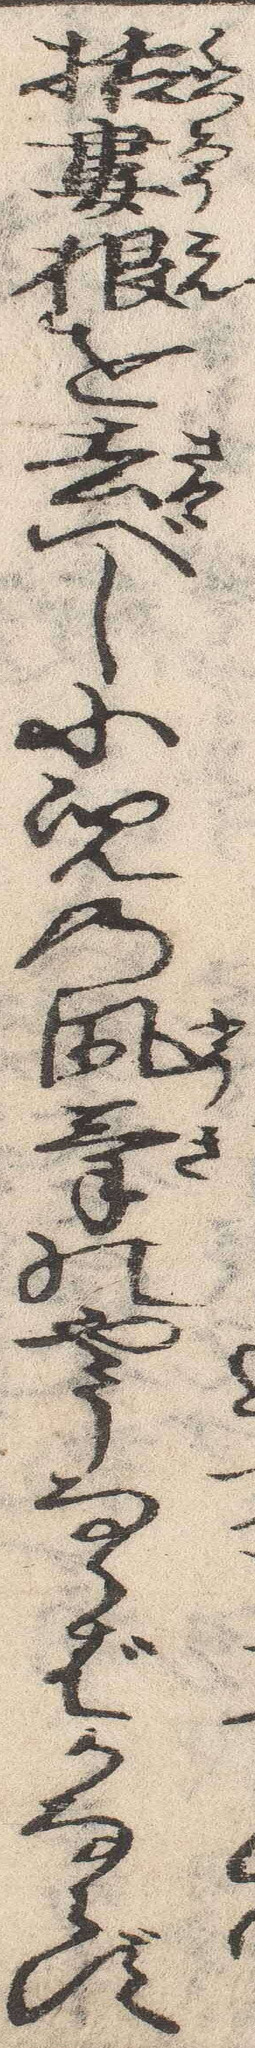括蔞根を去べし小児の風気のやうならばかならず
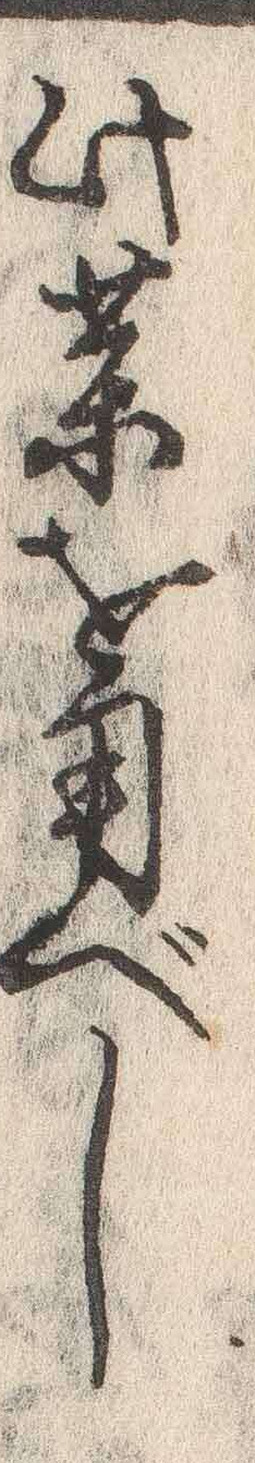此薬を用べし
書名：小児必用養育草
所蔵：東京学芸大学附属図書館 国文学研究資料館
